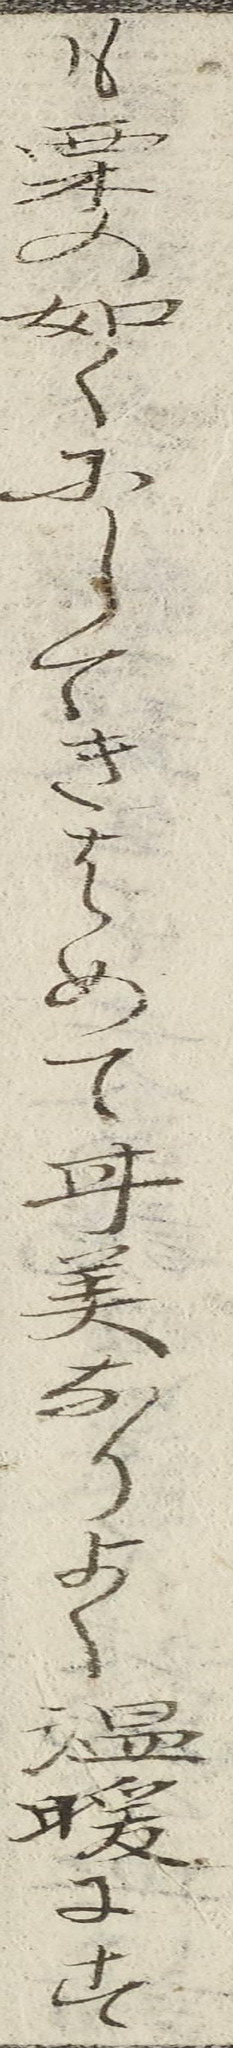も栗の如くにしてきはめて甘美なりよく温暖にす
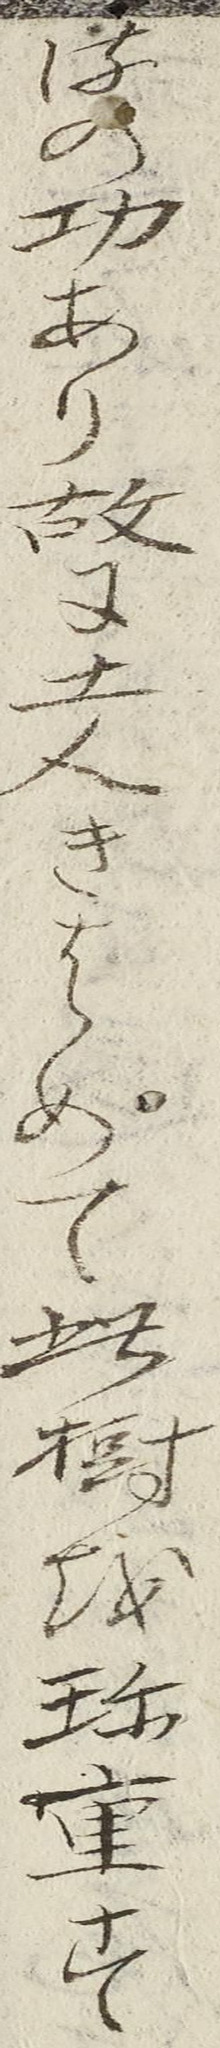るの功あり故に土人きはめて此樹を珍重す
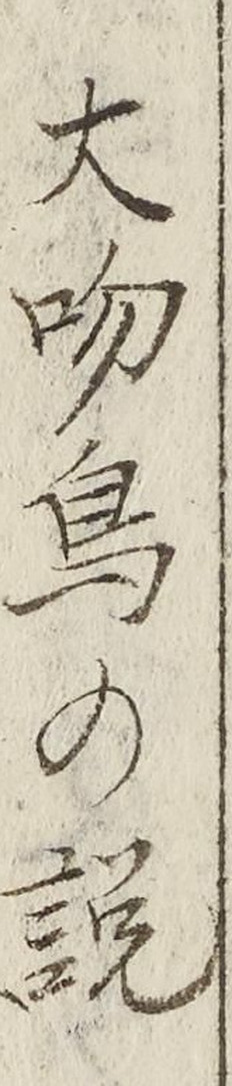大吻鳥の説
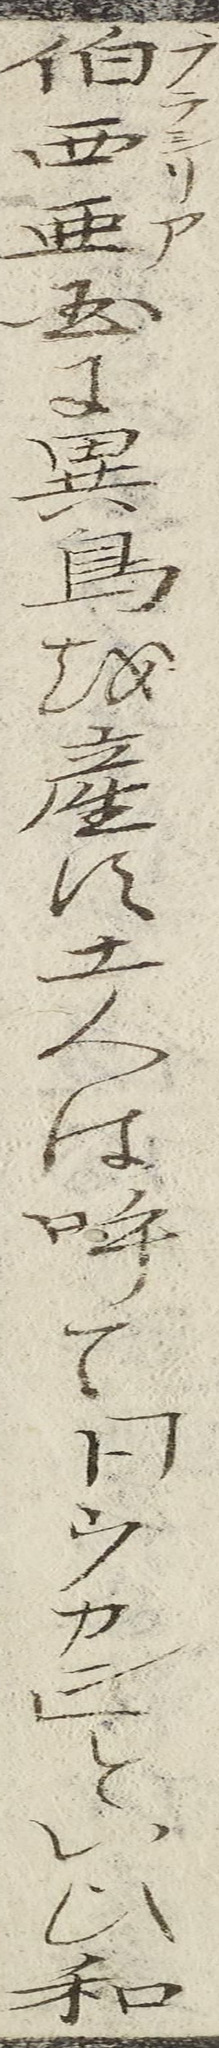伯西亜国に異鳥を産す土人は呼て「トウカン」といひ和
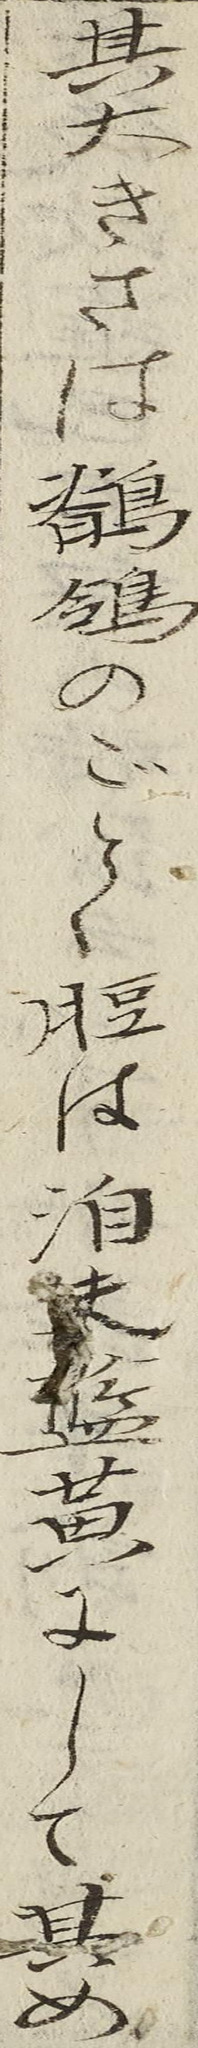其大きさは鶺鴒のごとく脰は洎夫藍黄にして其め
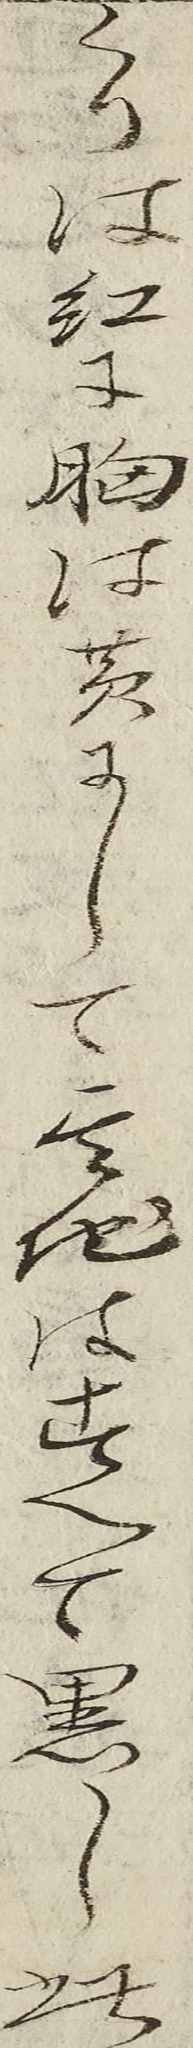くりは紅に胸は黄にして其他はすへて黒し此
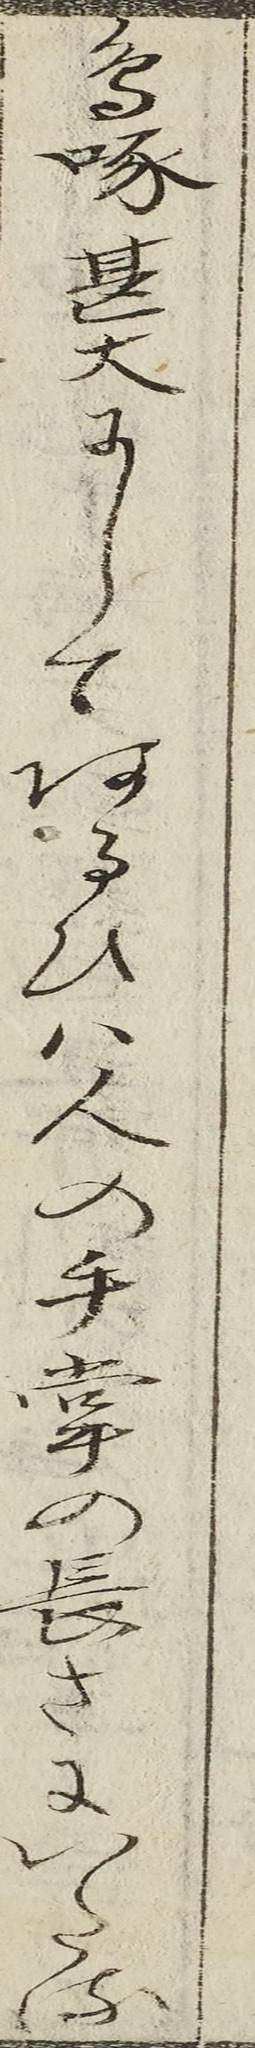鳥啄甚大にしてあるひは人の手掌の長さにいたる
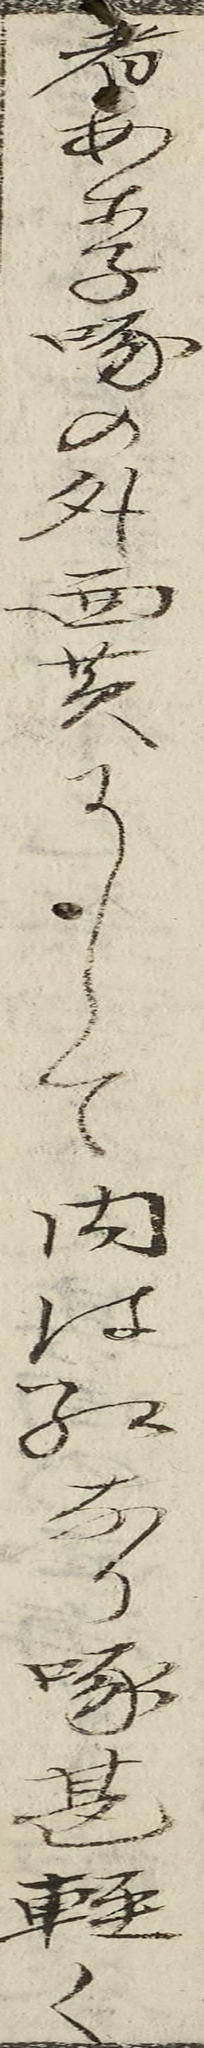者あり子啄の外面黄にして内は紅なり啄甚軽く
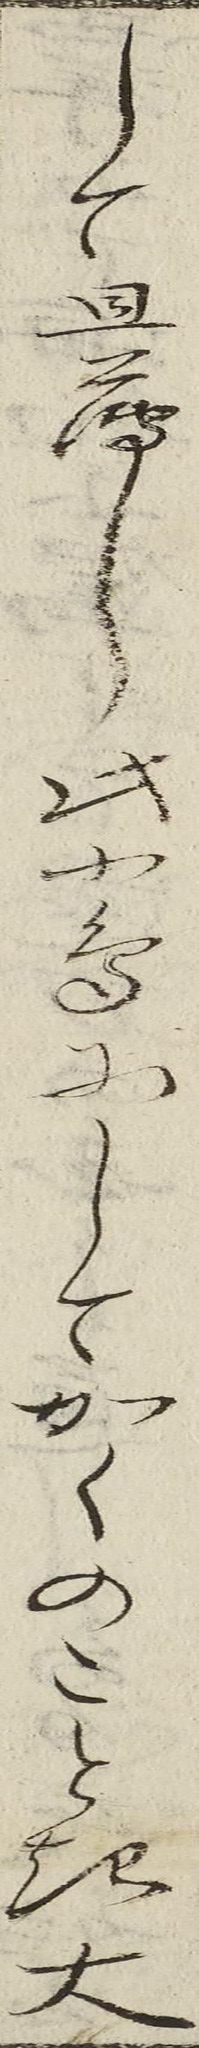して且薄し此小鳥にしてかくのことき大
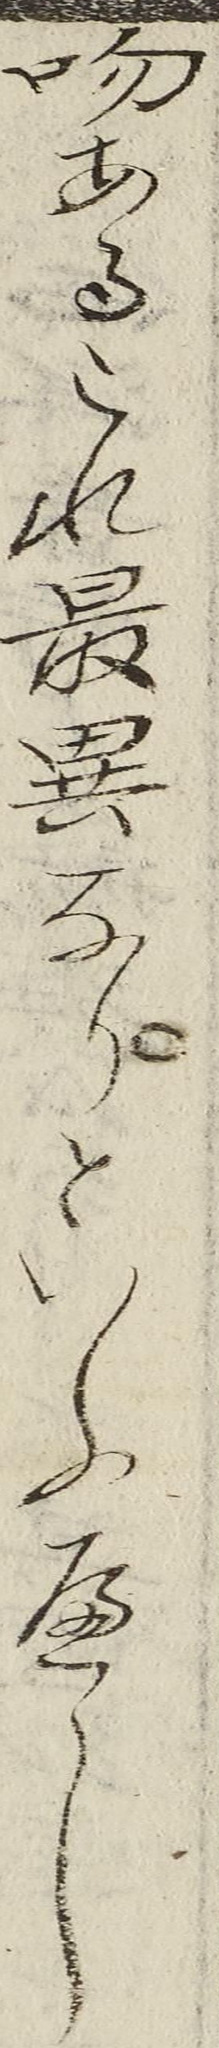吻あるこれ最異なりといふへし
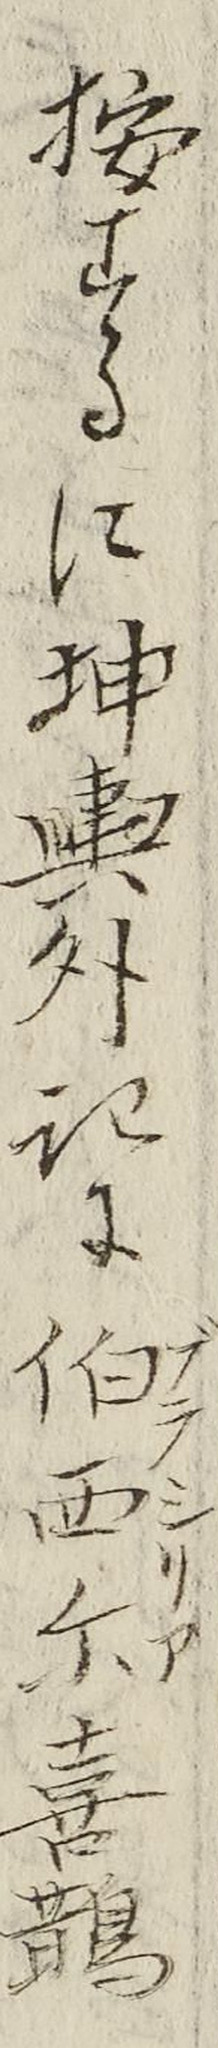按するに坤輿外記に伯西尓喜鵲
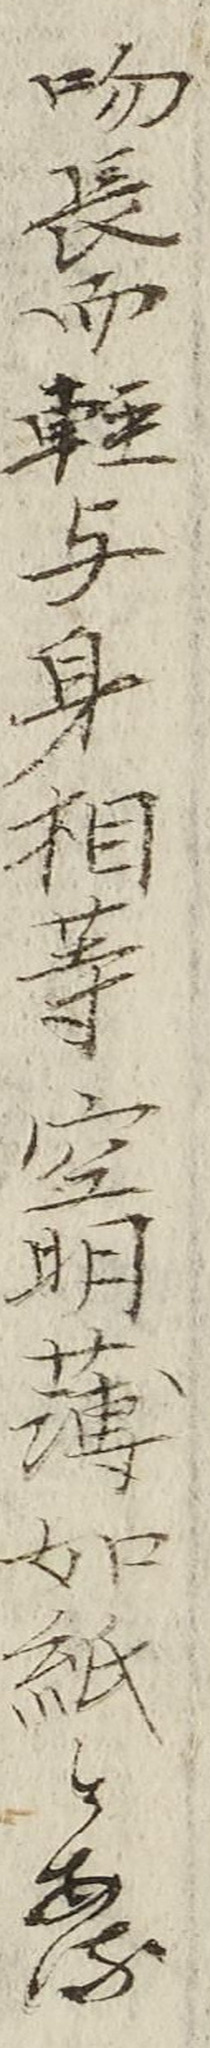吻長而軽与身相等空明薄如紙とある
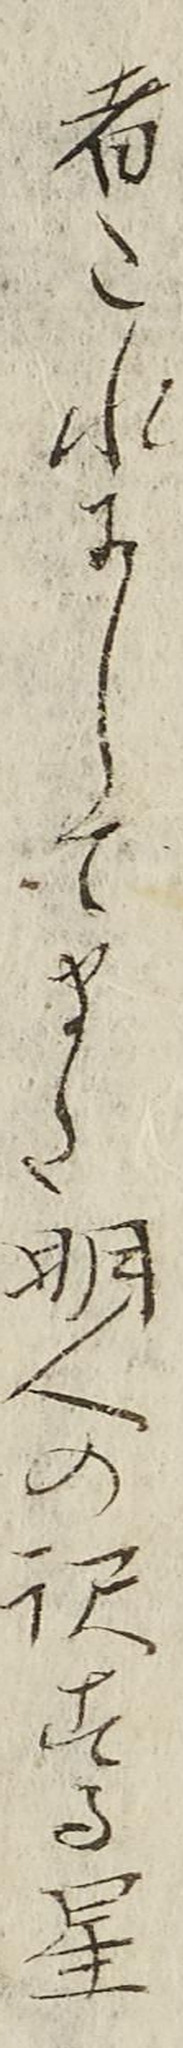者これにしてまた明人の訳する星
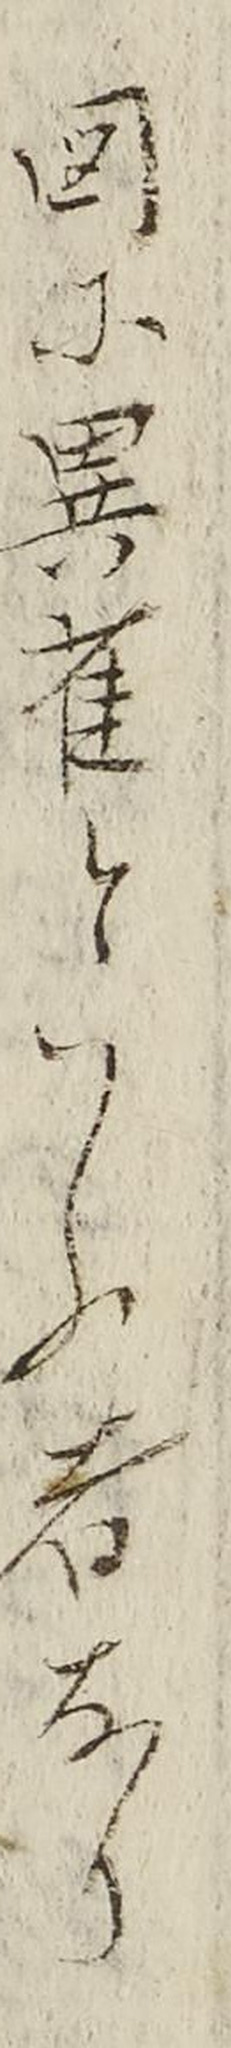図に異雀といふ者なり

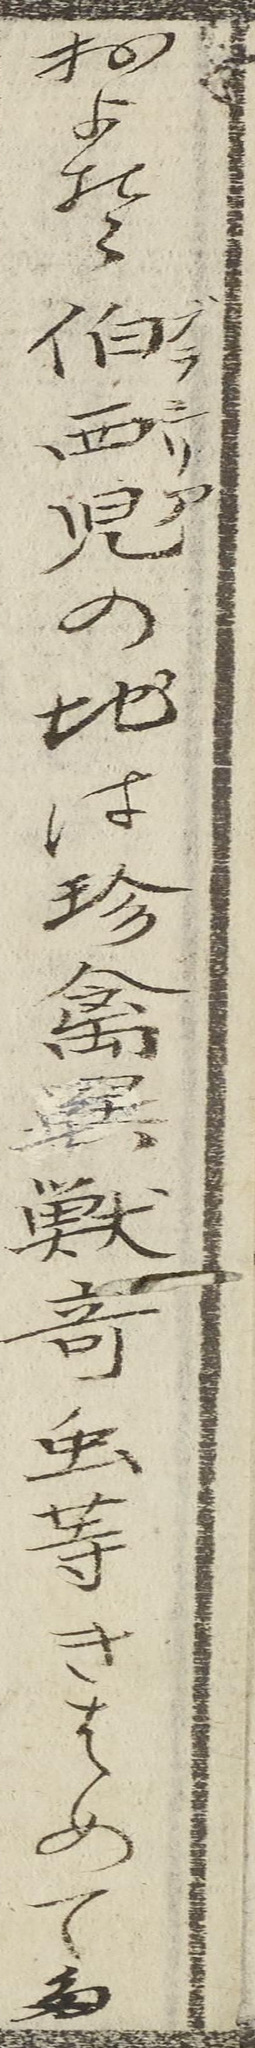およそ伯西児の地は珍禽異獣奇虫等きはめて多
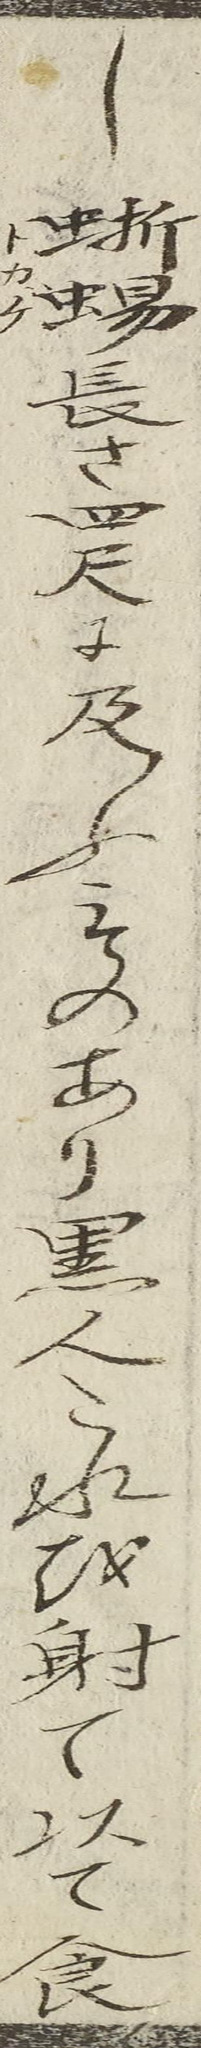し蜥蜴長さ四尺に及ぶものあり黒人これを射て以て食
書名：西洋雜記　乾
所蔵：東京大学地震研究所図書室 Earthquake Research Institute Library, The University of Tokyo, JAPAN
